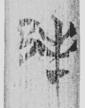邦
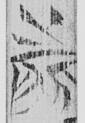之日
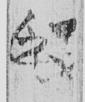○（賢）
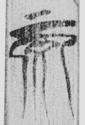而
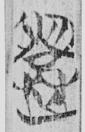{興止}（興）
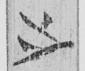之
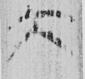大
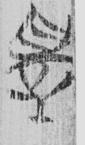辠（罪）
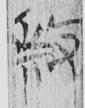殺
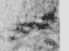之
